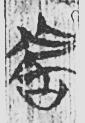者
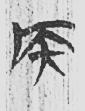侯
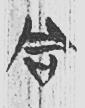同
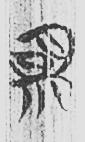{明示}
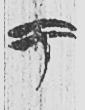于
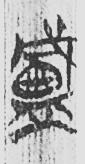鹹
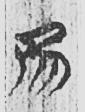泉
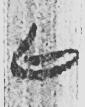㠯（以）
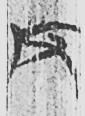反
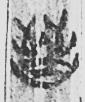晉
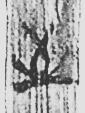至
